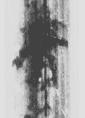夫
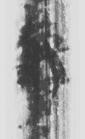幾
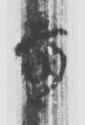可
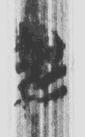{弓口二}
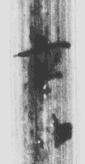才
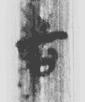古
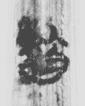昔
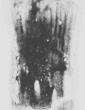之
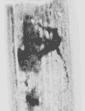又
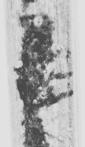國
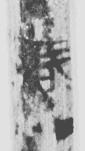者
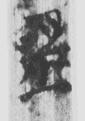{明皿}
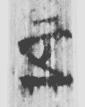正
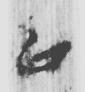㠯（以）
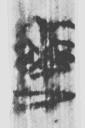麥
